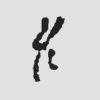左
